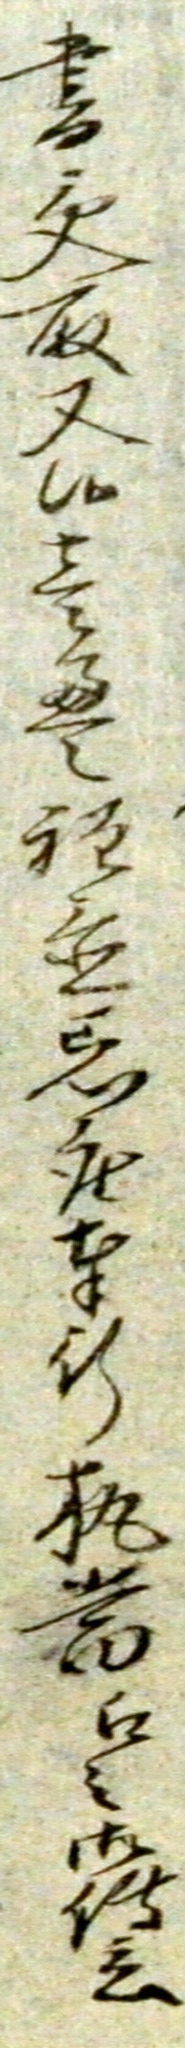書受取又候壱畳程置着座奉行執当江者御伝言
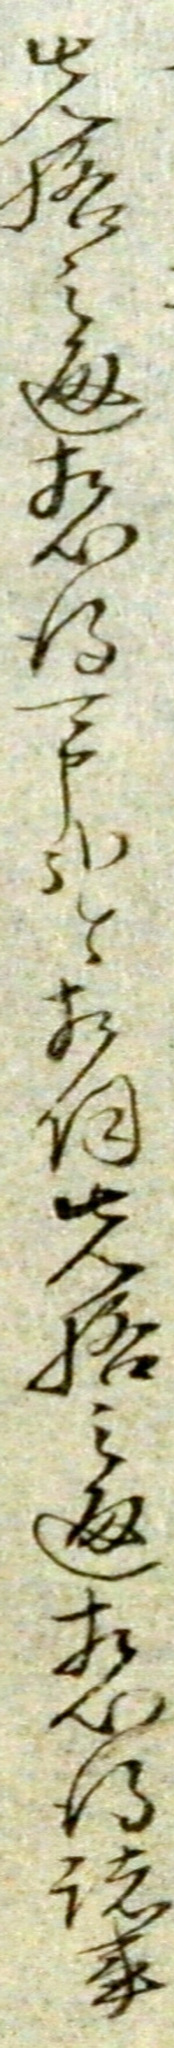先格之通相心得可申哉と相伺先格之通相心得諸事
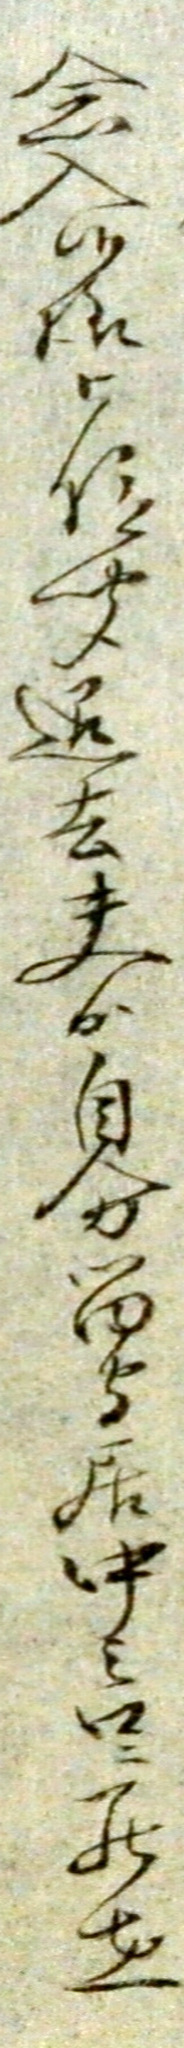念入候様ヒ仰聞退去夫ゟ自分留守居中之口二罷在
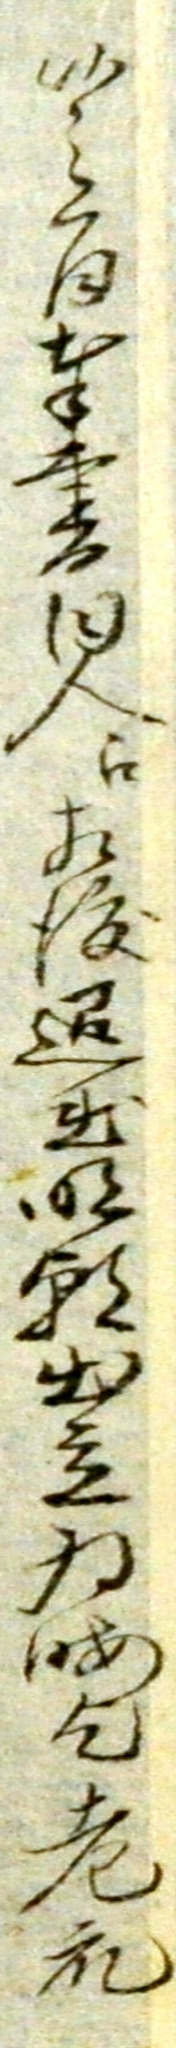候之間奉書同人江相渡退出明朝出立為暇乞老衆
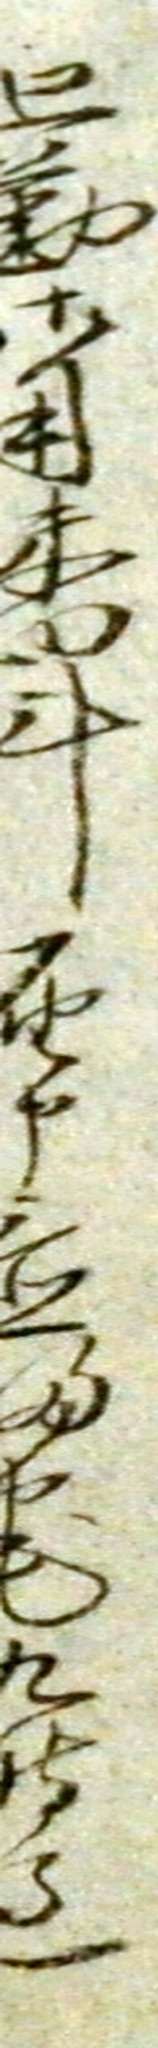廻勤御用番斗届申置帰宅九時

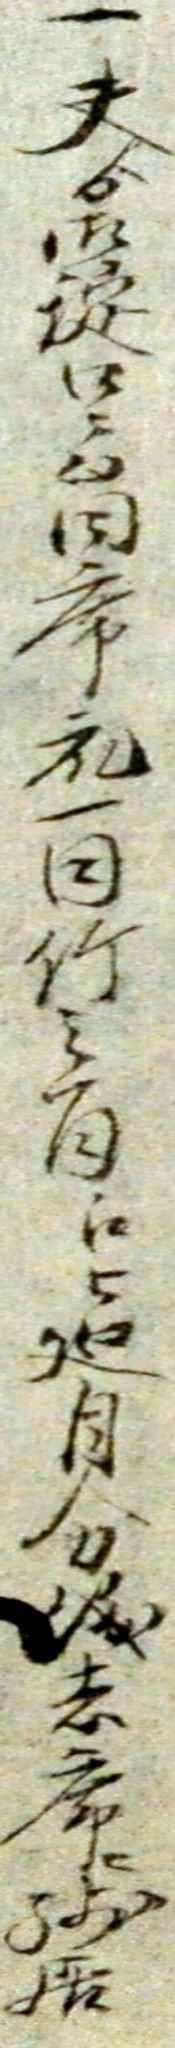一夫ゟ御錠口ニ而同席衆一同竹之間江ヒ廻自分儀者席江残居
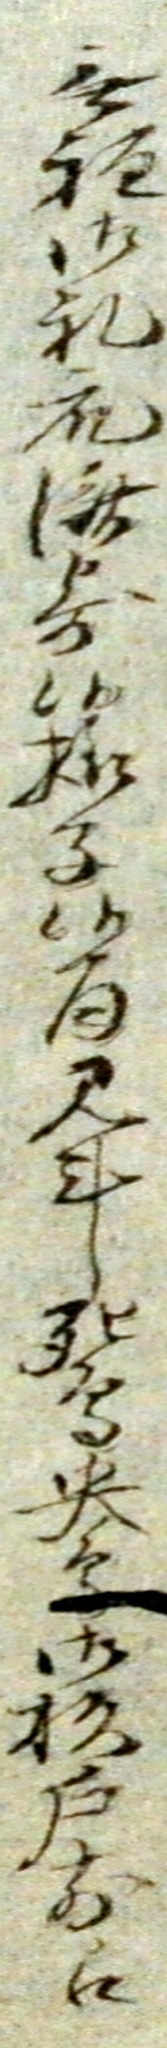無程御礼衆済寄候様子候間見計鴛鴦御杉戸前江
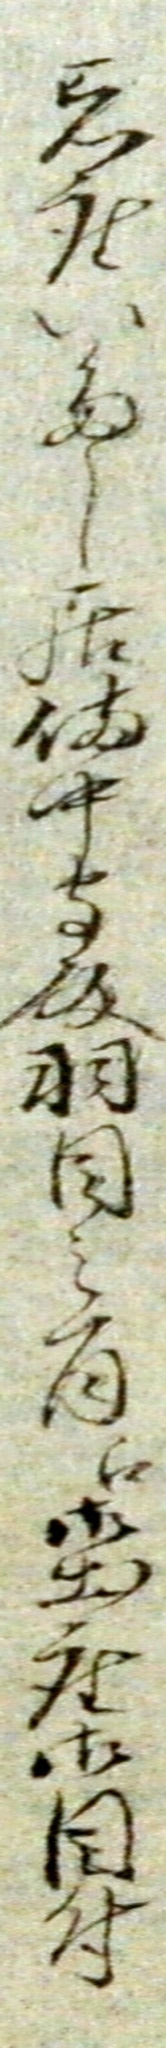着座い多し居備中守殿羽目之間江御出座御目付
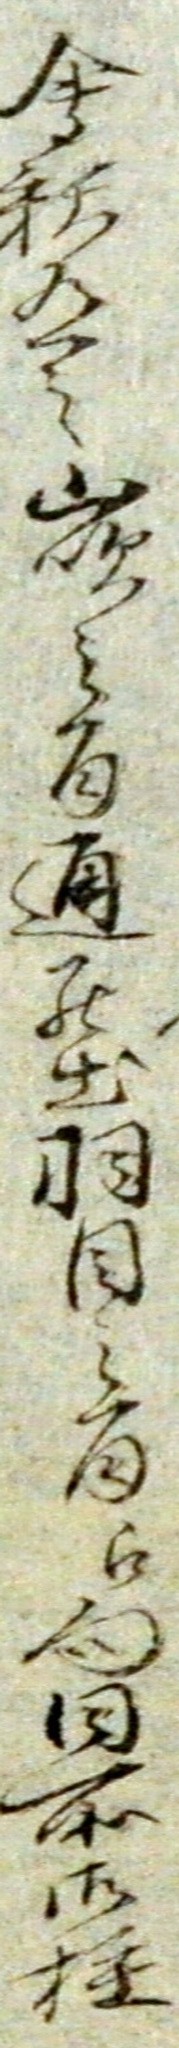会釈有之山吹之間通罷出羽目之間江向同所御柱
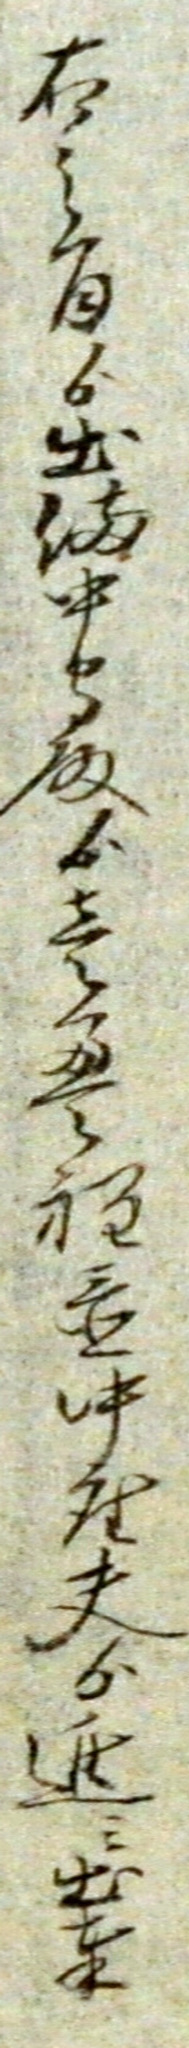右之間ゟ出備中守殿ゟ壱畳程置中夫進ミ出奉
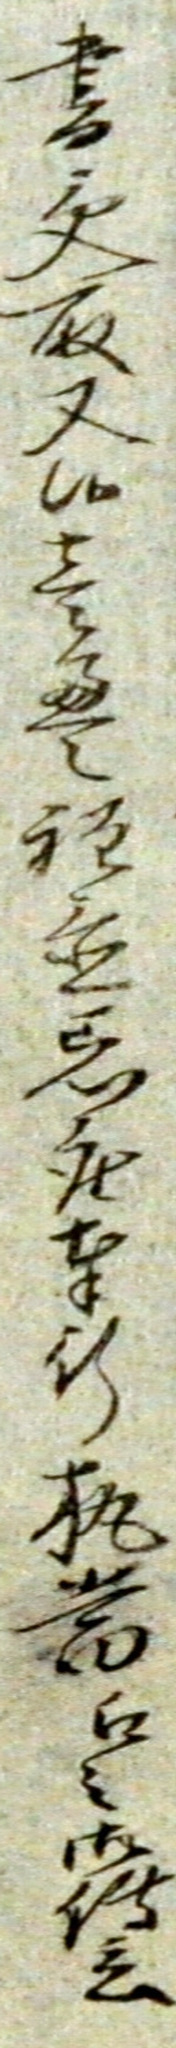書受取又候壱畳程置着座奉行執當江者御伝言
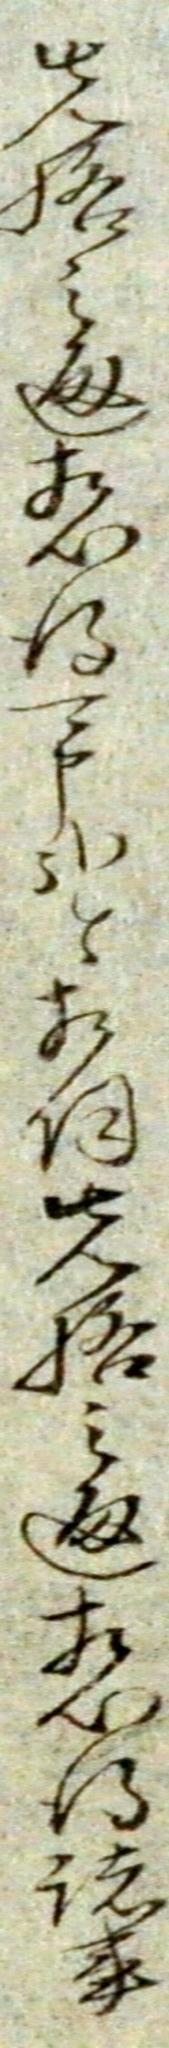先格之通相心得可申哉と相伺先格之通相心得諸事
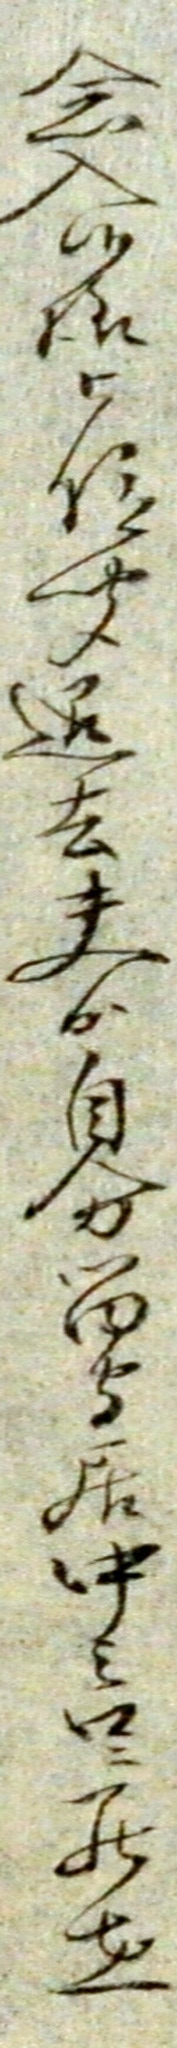念入候用ヒ仰聞退去夫ゟ自分留守居中之口二罷在
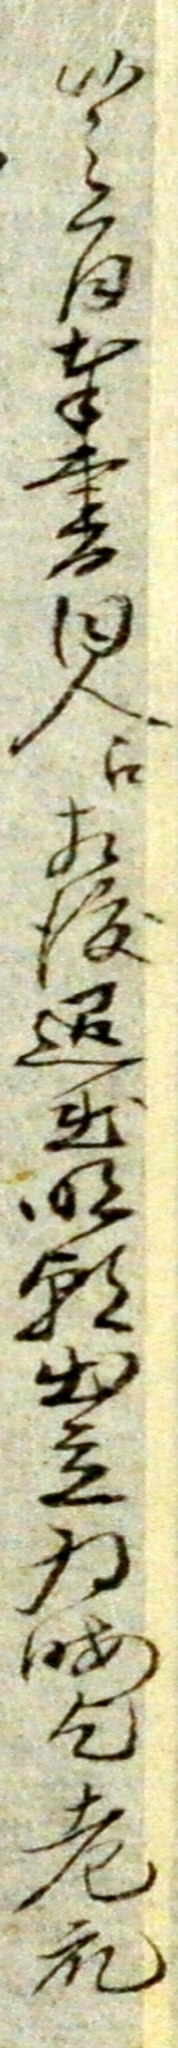候之間奉書同人江相渡後退出明朝出立為暇乞老衆
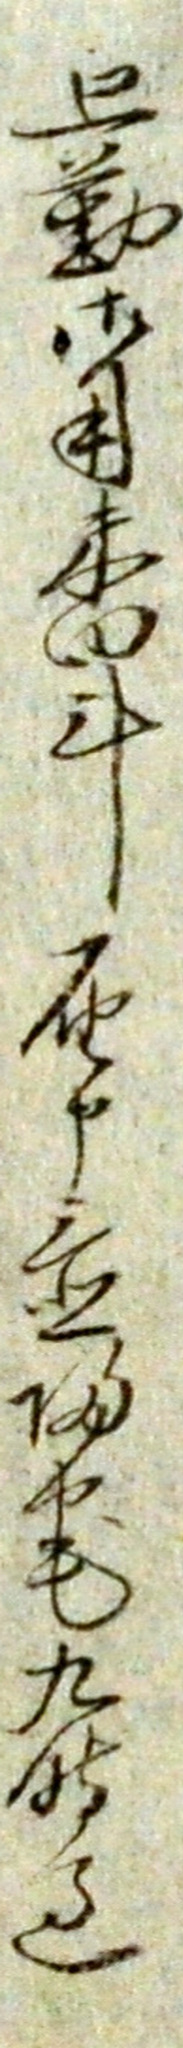廻勤御用番斗届申置帰宅九時過
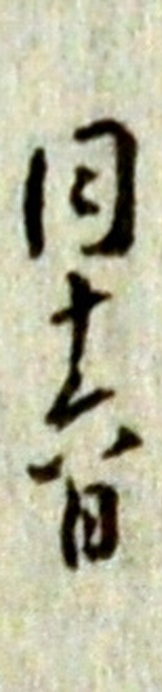同十六日
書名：日光御名代相勤候節ノ留
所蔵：伊那市立高遠町図書館・合同会社AMANE
